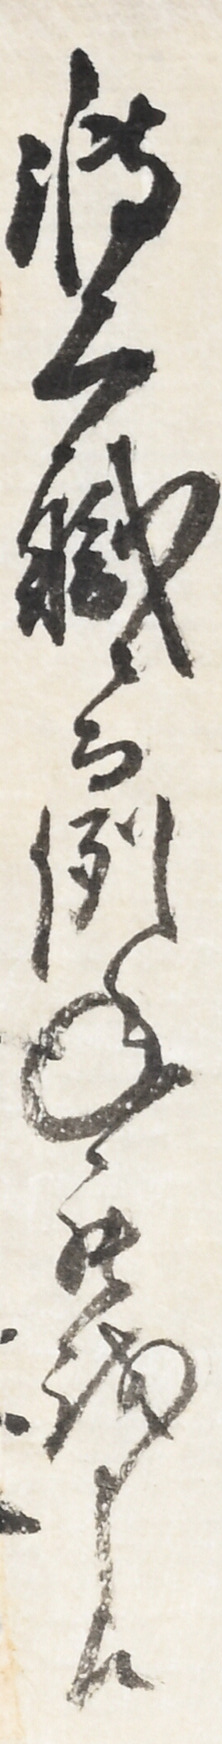転士職ニ而例年罷越申候
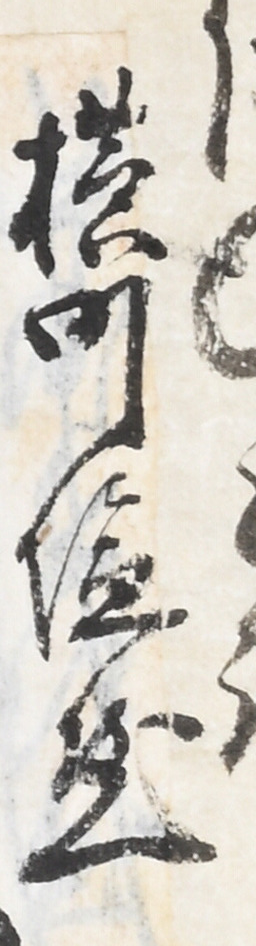横町塩屋
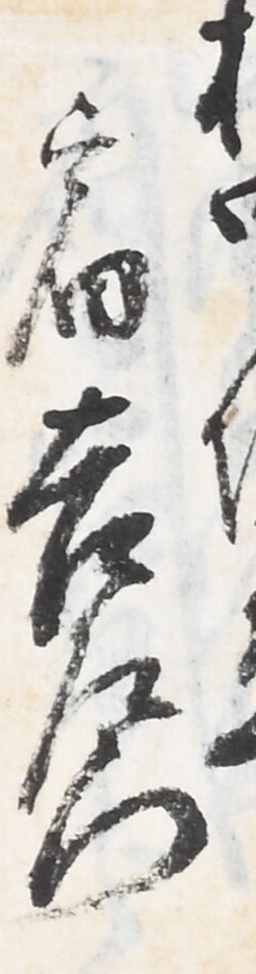宿吉左衛門
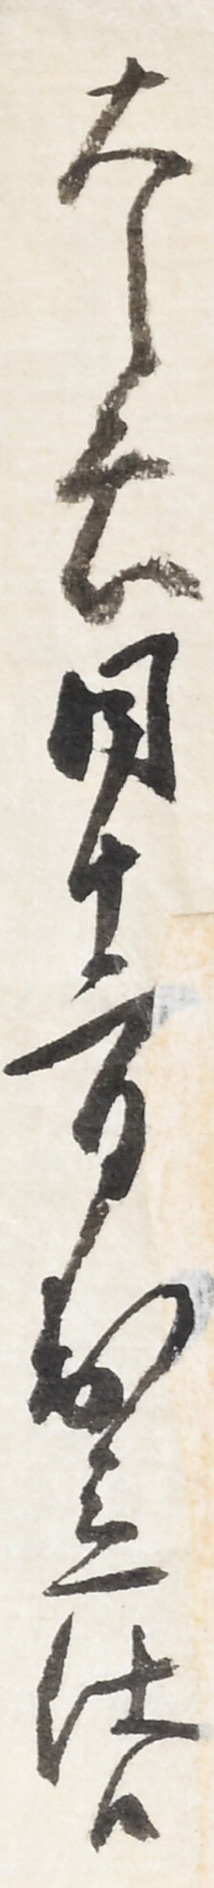右之者同十二日出立仕候
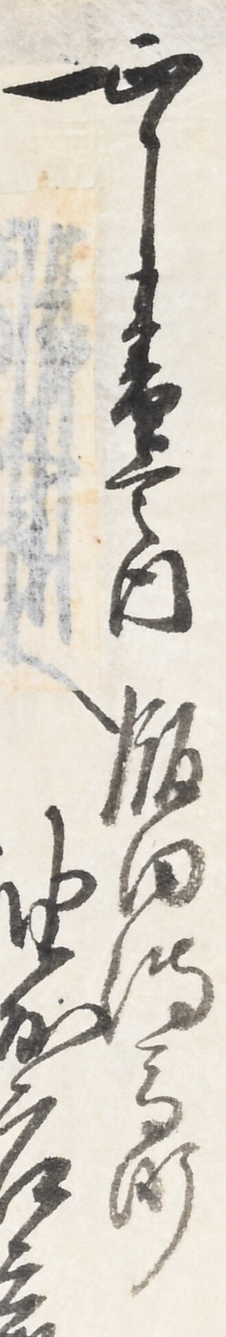正月書上之内飯田伝馬町
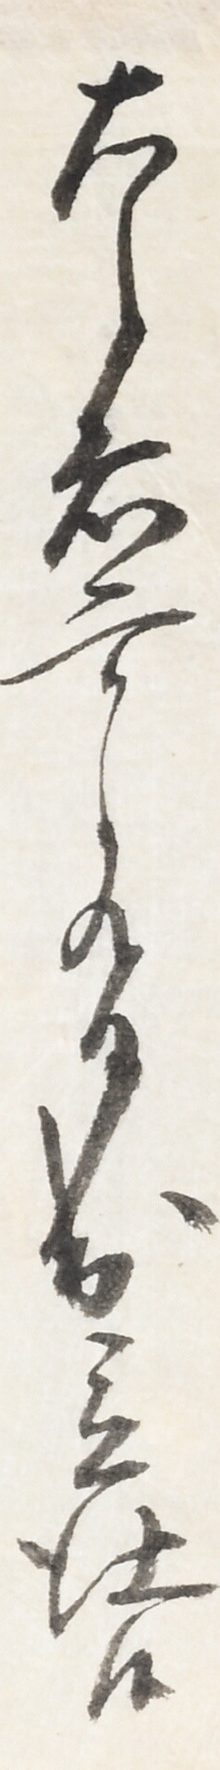右之者弐月九日出立仕候
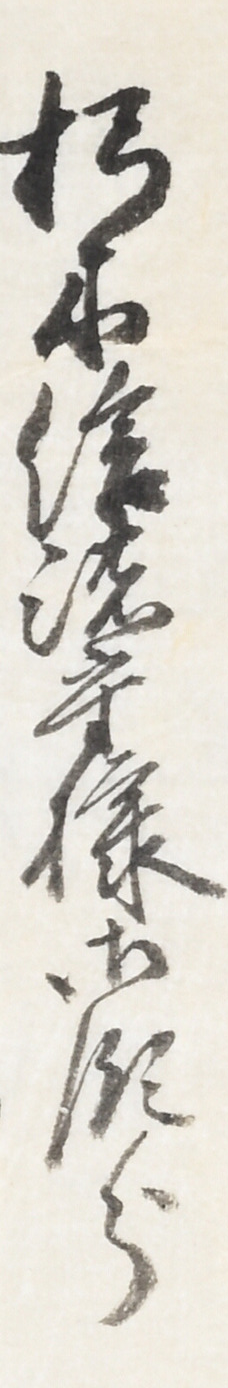朽木信濃守様御領分
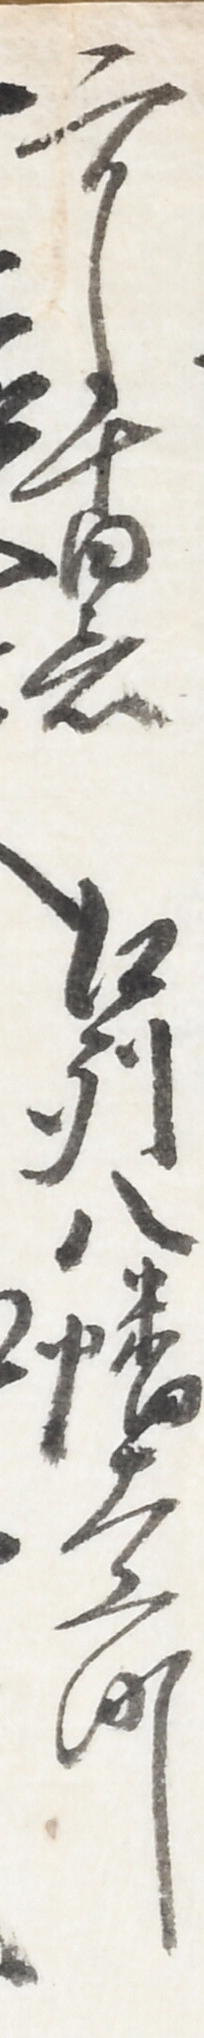二月十日着江州八幡大工町
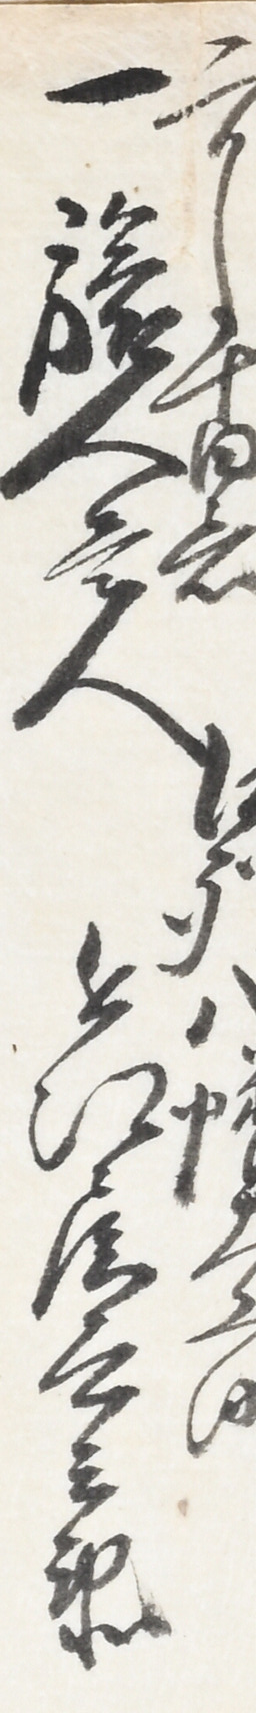一旅人壱人近江屋太兵衛
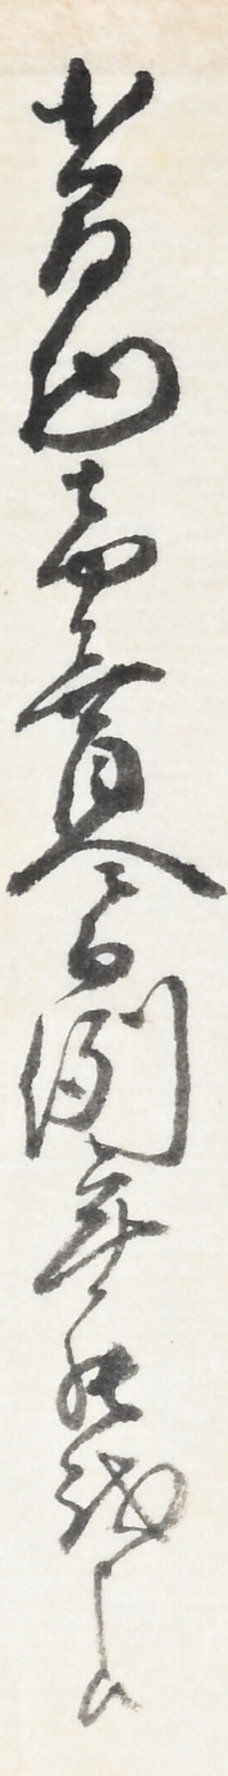小間物商売ニ而例年罷越申候
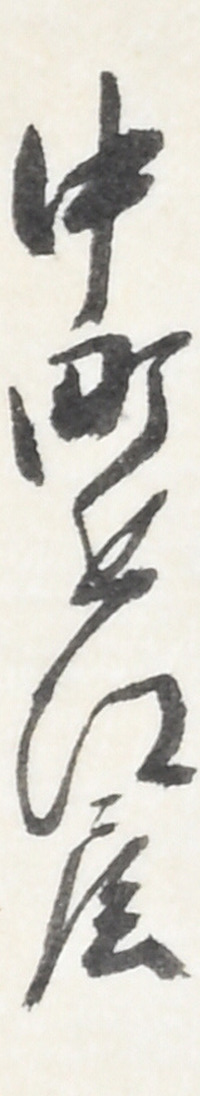中町近江屋
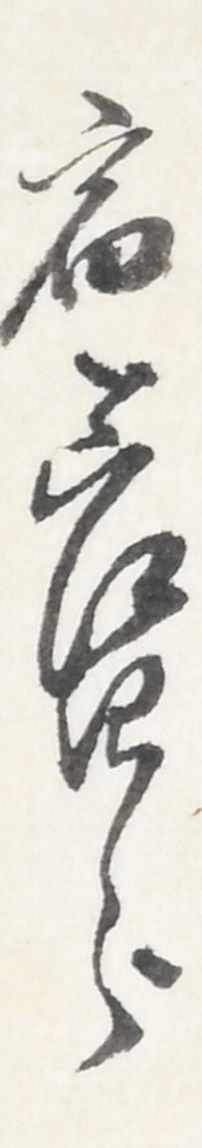宿善四郎
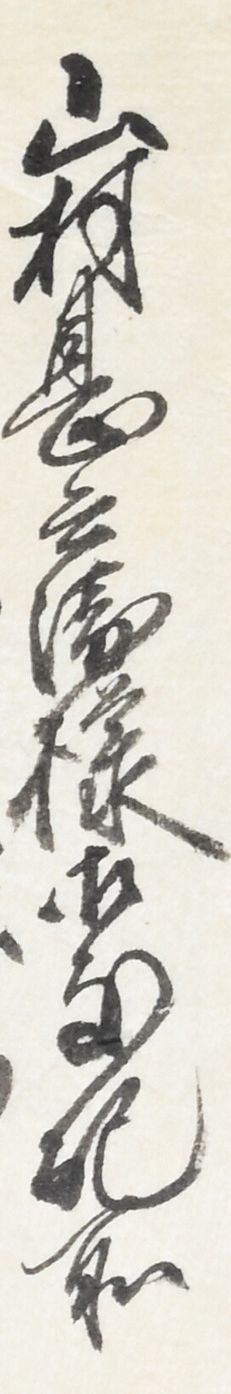山村甚兵衛様御支配所
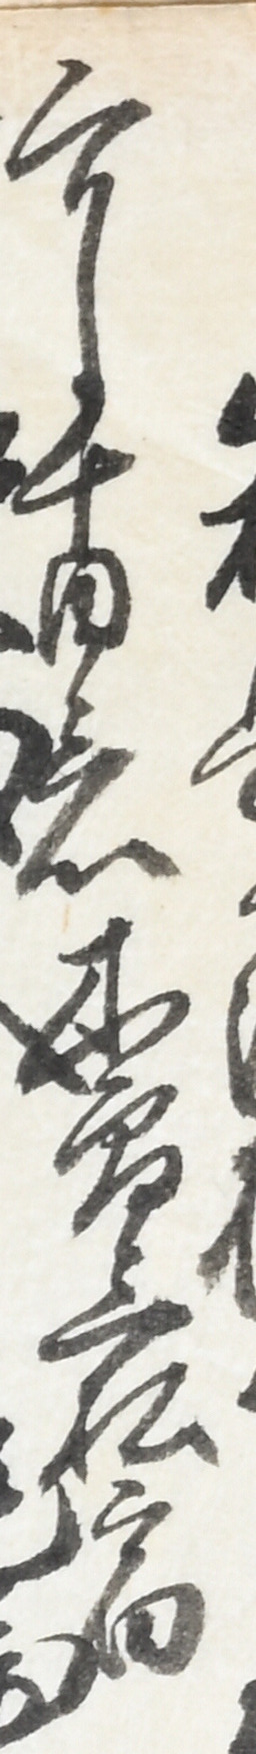二月十日着木曽上松宿
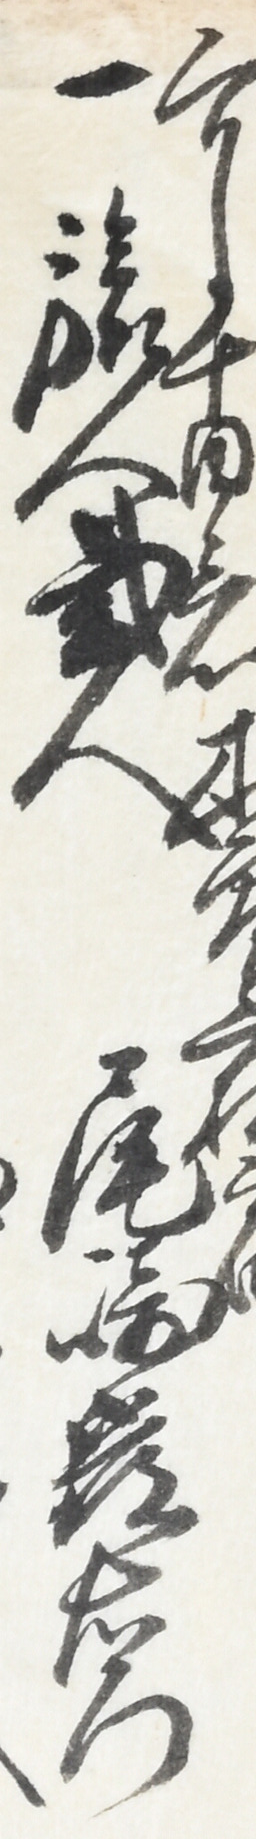一旅人弐人尾崎厳右衛門
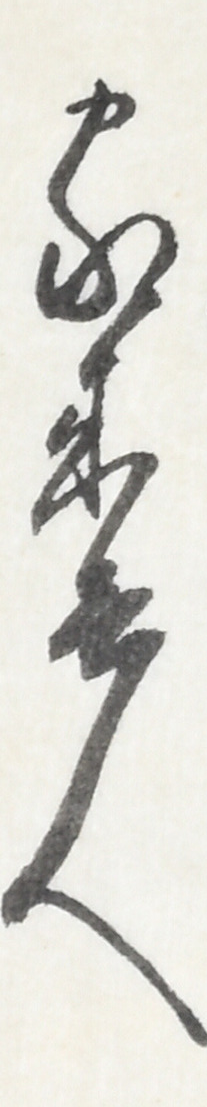家来壱人
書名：旅人泊控帳
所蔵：伊那市立高遠町図書館・合同会社AMANE
